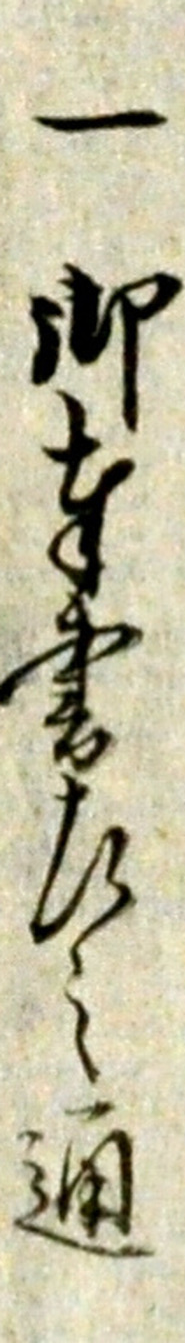一御奉書左之通
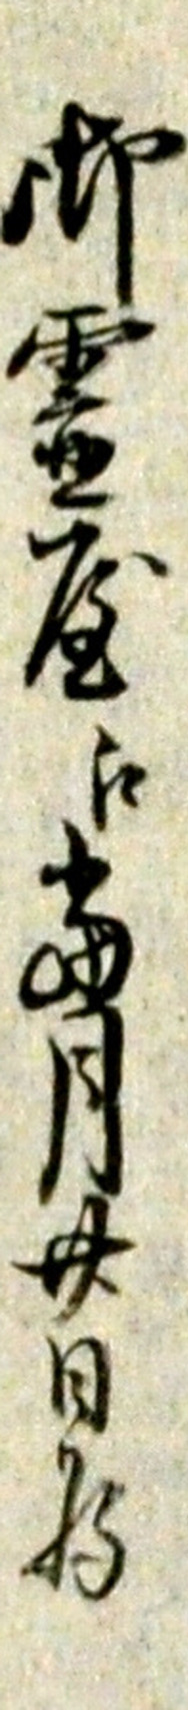御霊屋江当月廿日為
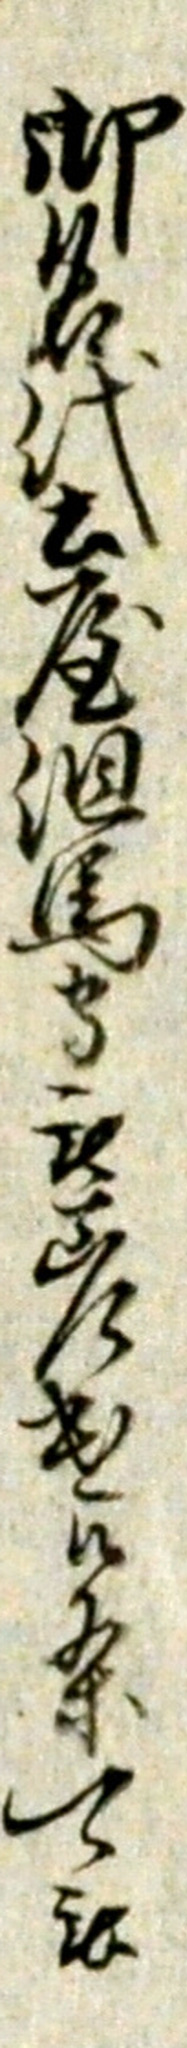御名代土屋但馬守被差遣候条可被
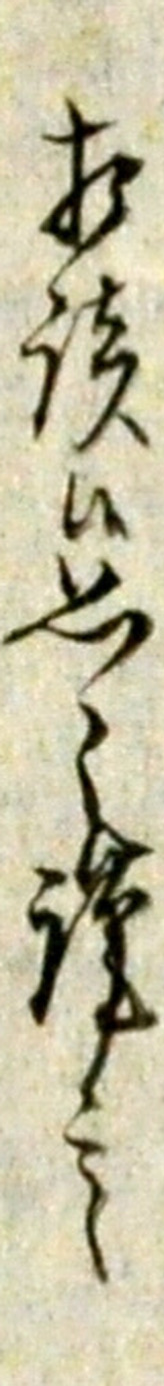相談候恐々謹言
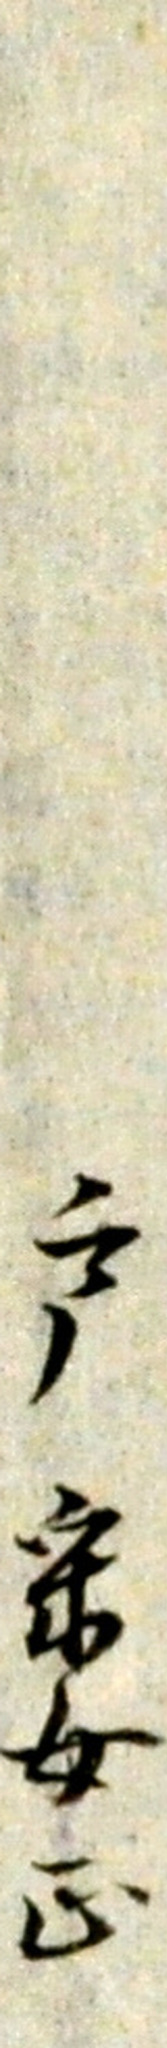戸采女正
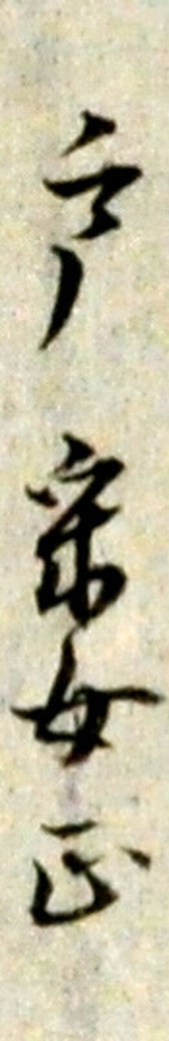戸采女正
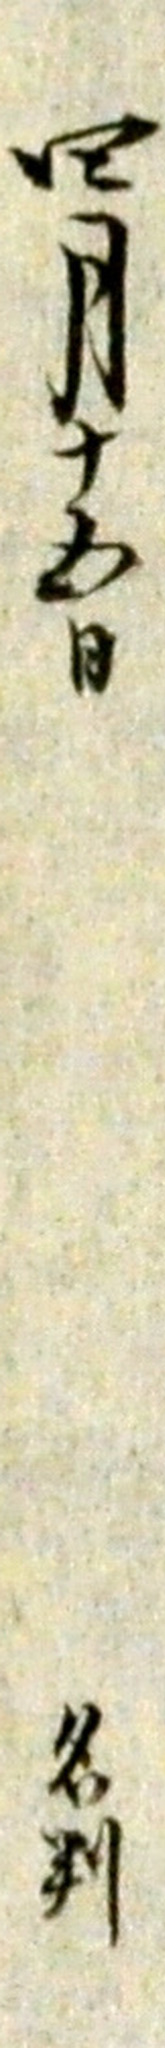四月十五日名判
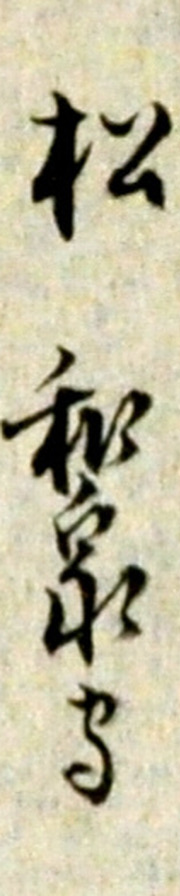松和泉守
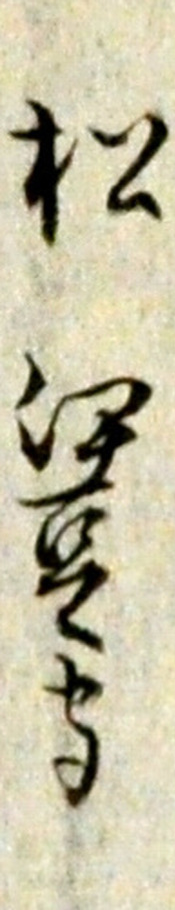松伊豆守
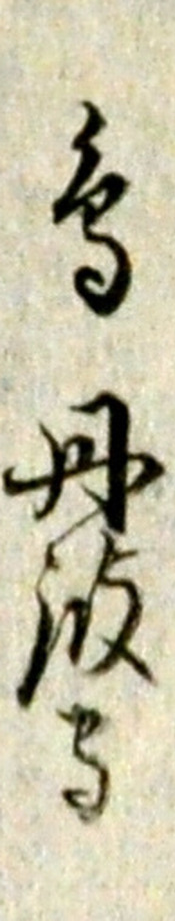鳥丹波守
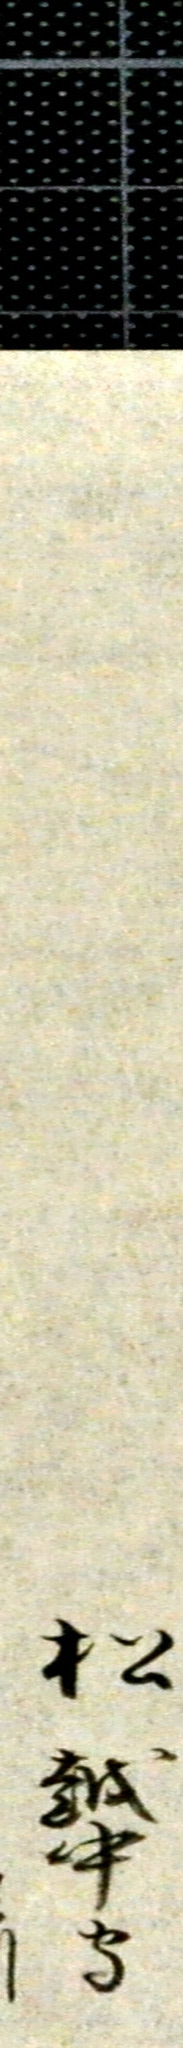松越中守
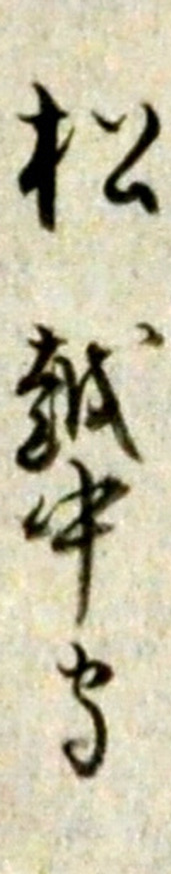松越中守
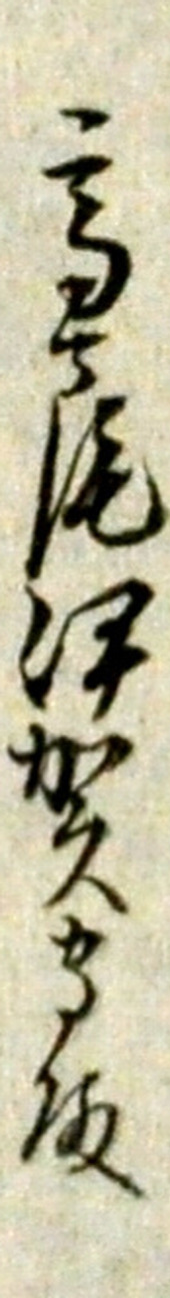高尾伊賀守殿
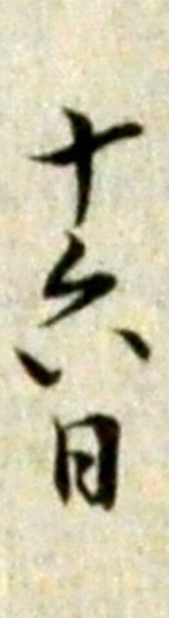十六日
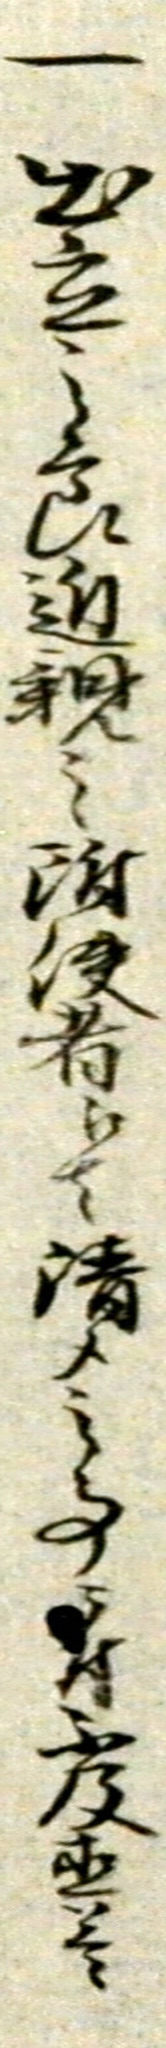一出立之節近親之附使者江者清メ之事ニ付不及直答
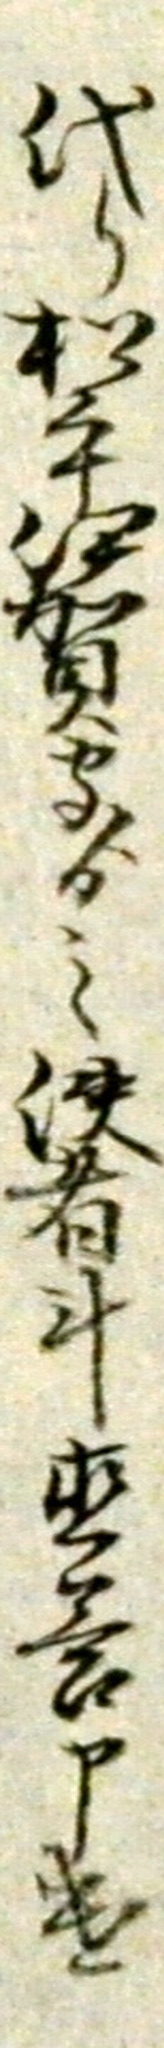代り松平伊賀守ゟ之使者斗直答申遣
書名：日光御名代相勤候節ノ留
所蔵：伊那市立高遠町図書館・合同会社AMANE
